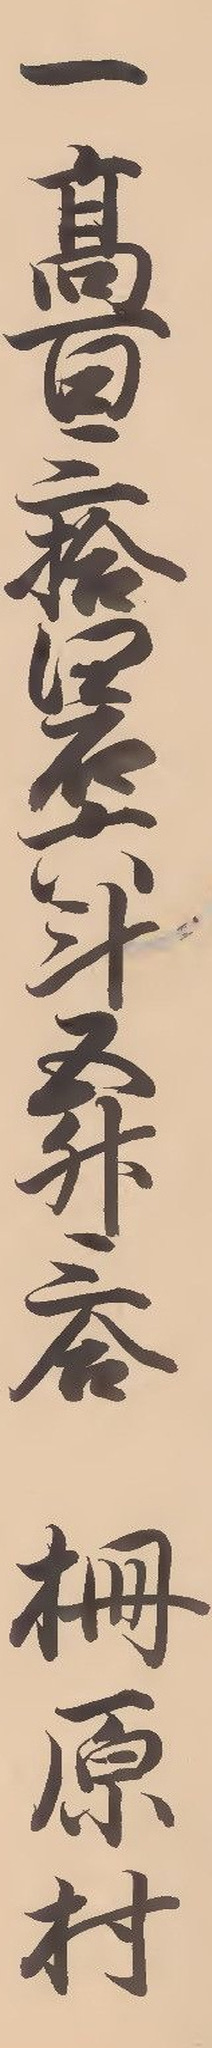一高百三拾四石六斗五升三合柵原村
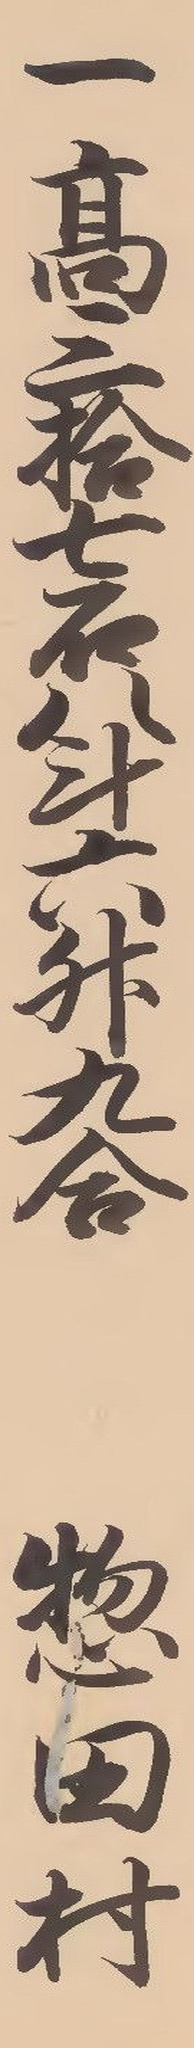一高三拾七石八斗六升九合惣田村
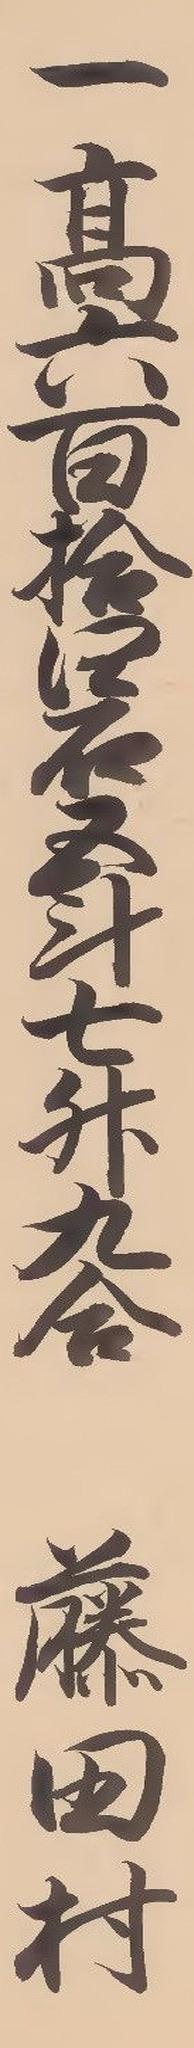一高六百拾四石五斗七升九合藤田村
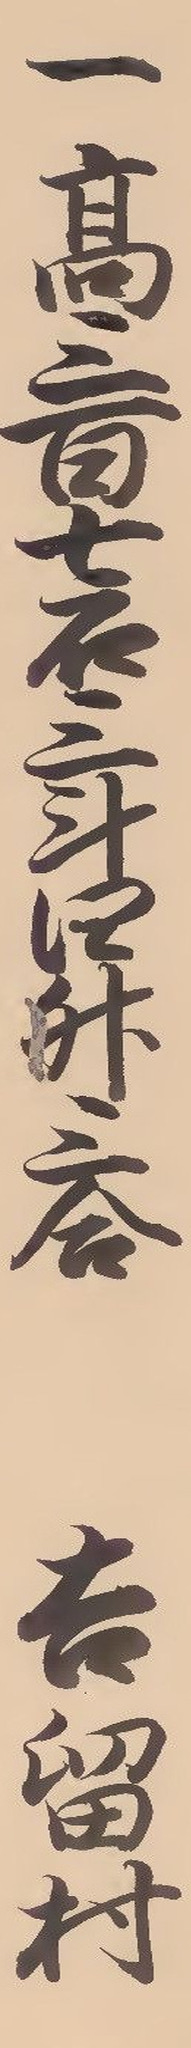一高三百七石三斗四升三合吉留村

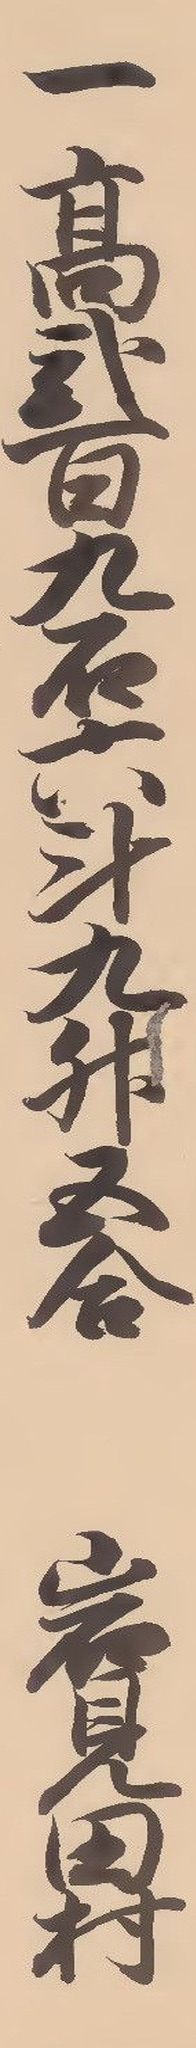一高弐百九石六斗九升五合岩見田村
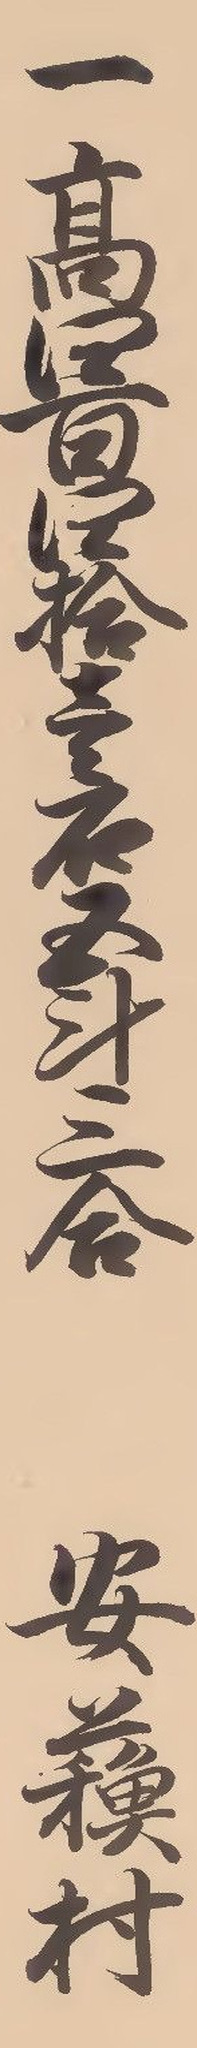一高四百四拾壱石五斗三合安蘇村
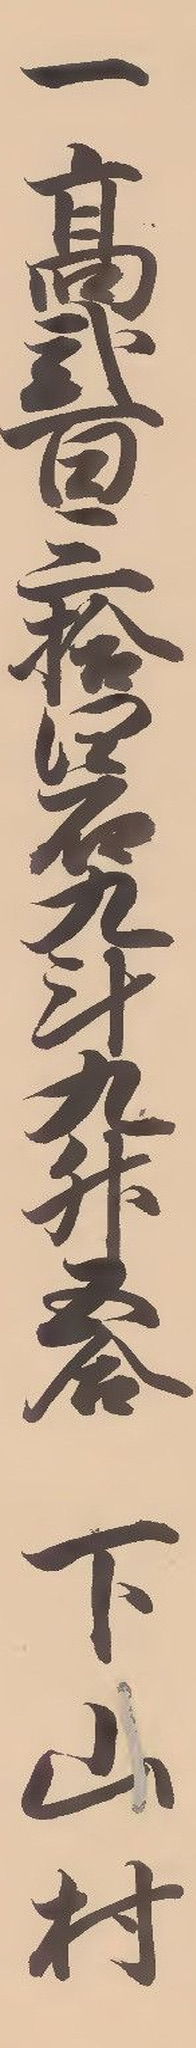一高弐百三拾四石九斗九升五合下山村
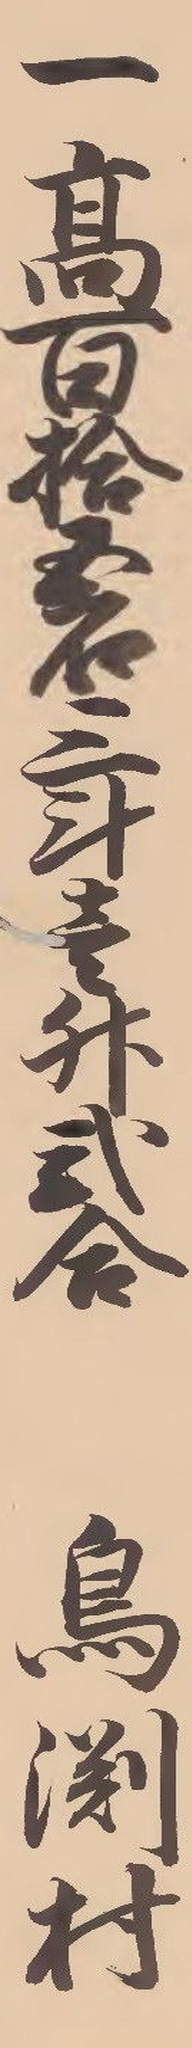一高百拾五石三斗壱升弐合鳥淵村
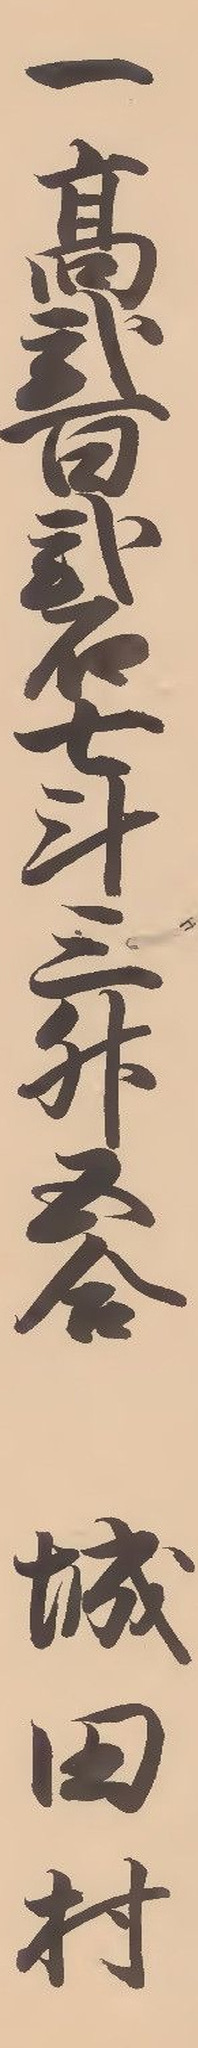一高弐百弐石七斗三升五合城田村
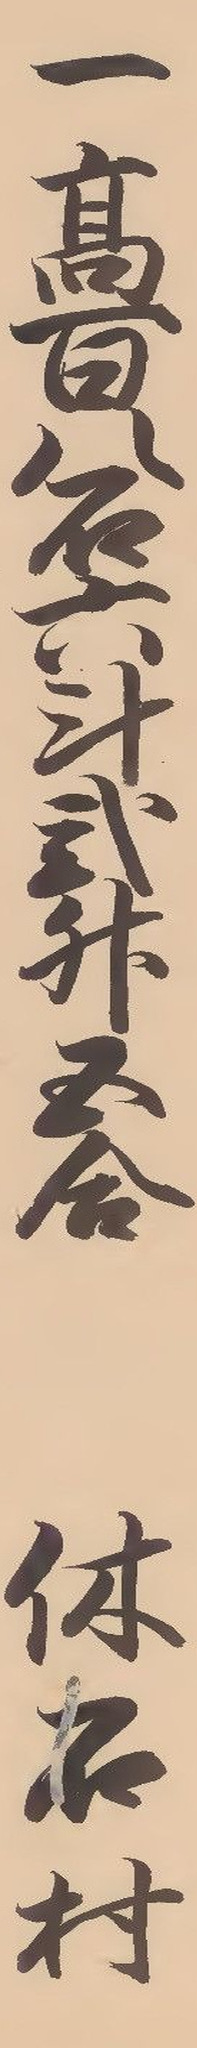一高百八石六斗弐升五合休石村
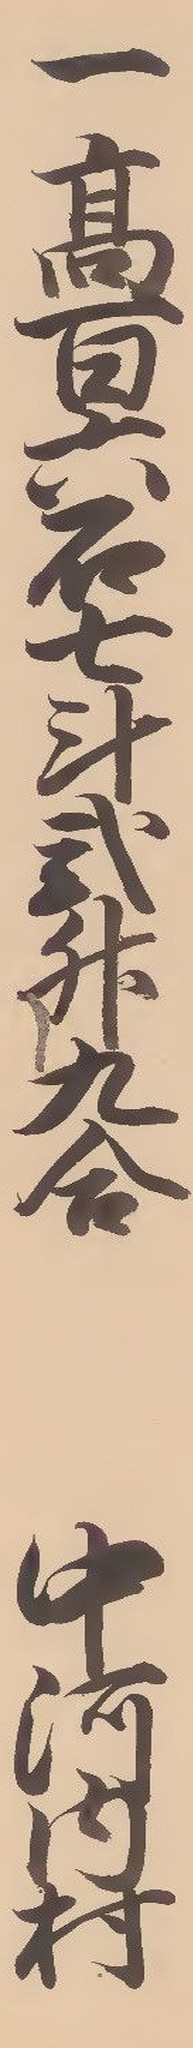一高百六石七斗弐升九合中河内村

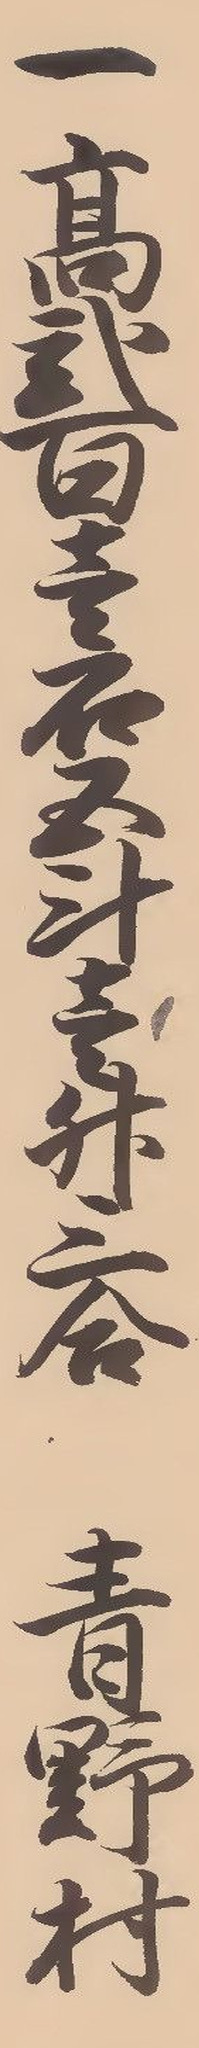一高弐百壱石五斗壱升三合青野村
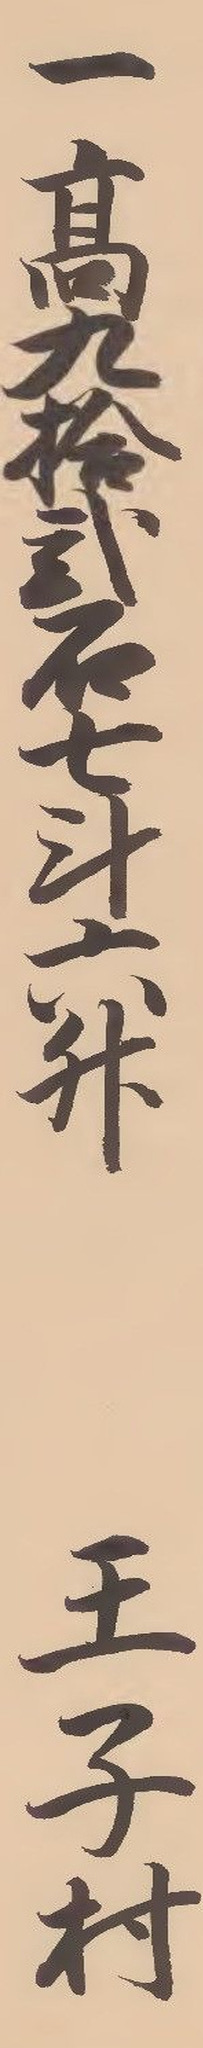一高九拾弐石七斗六升王子村
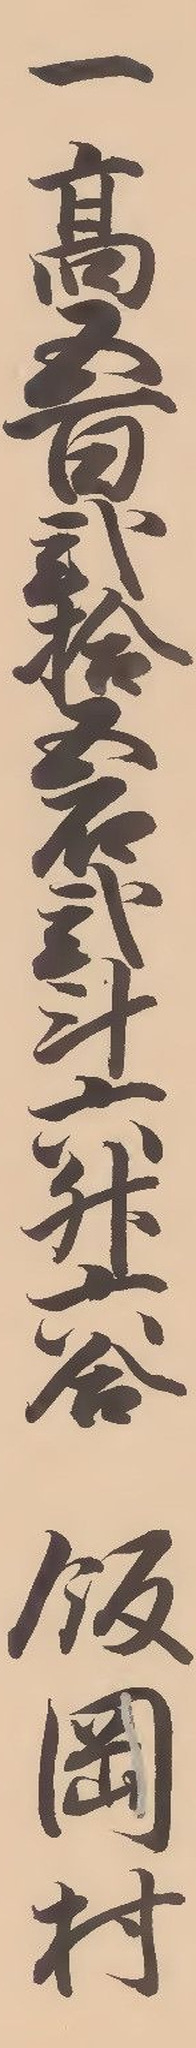一高五百弐拾五石弐斗六升六合飯岡村
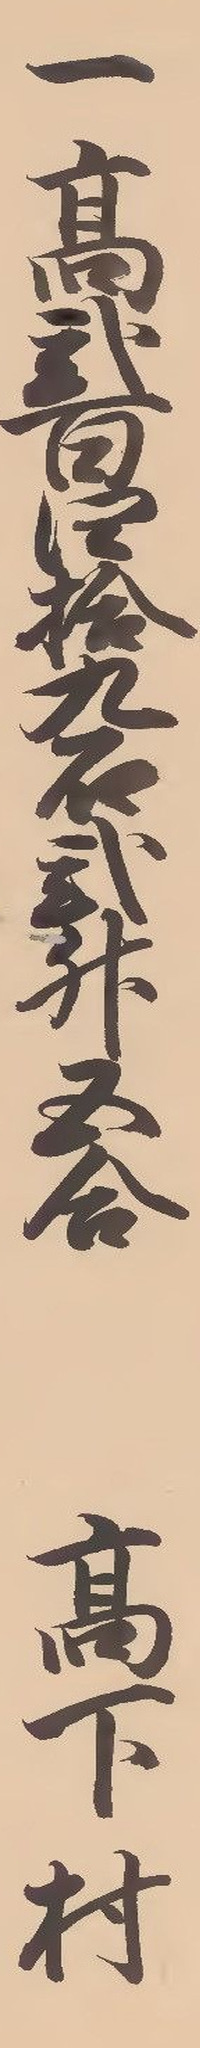一高弐百四拾九石弐升五合高下村
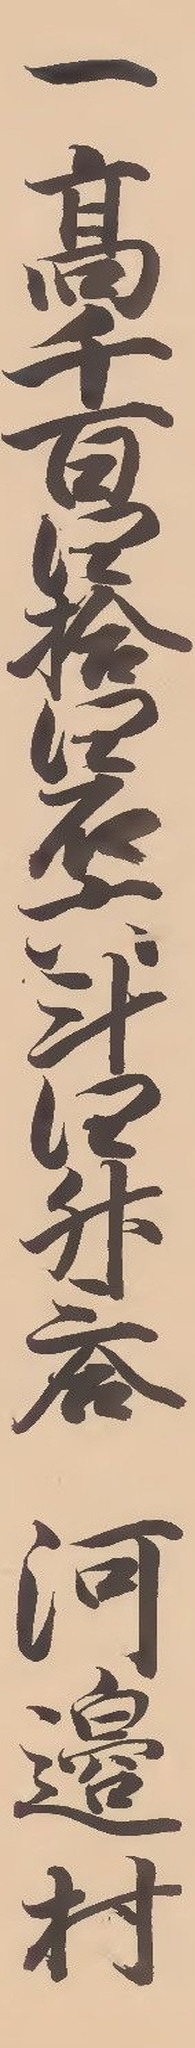一高千百四拾四石六斗四升三合河辺村
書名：美作国郷帳
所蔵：国立公文書館 National Archives of Japan
